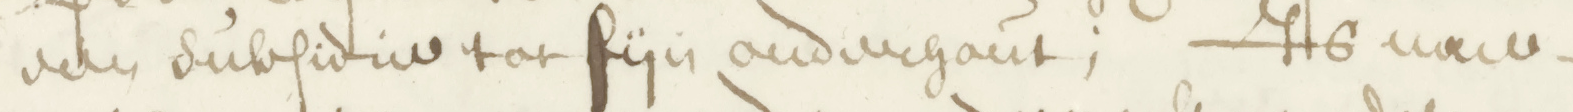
een subsidie tot sijn onderhout; Is nae
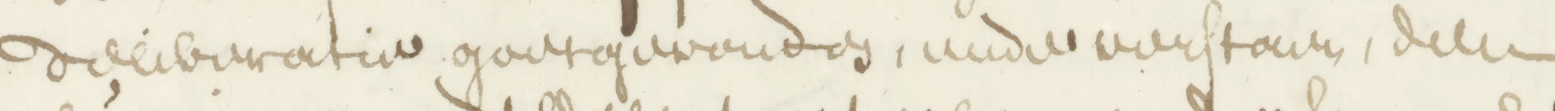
deliberatie goetgevonden, ende verstaen, den
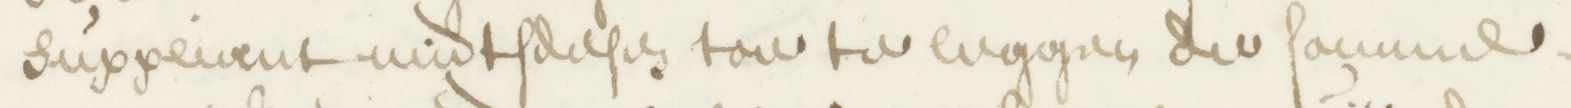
Suppliant midtsdesen toe te leggen de somme
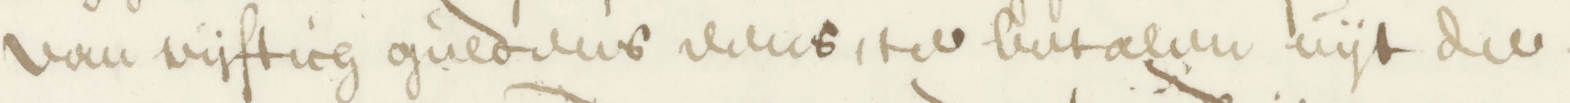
van vijftich guldens eens, te betalen uijt de
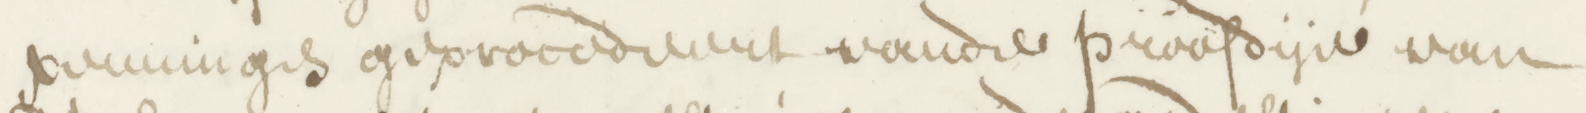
penningen geprocedeert vande proosdije van
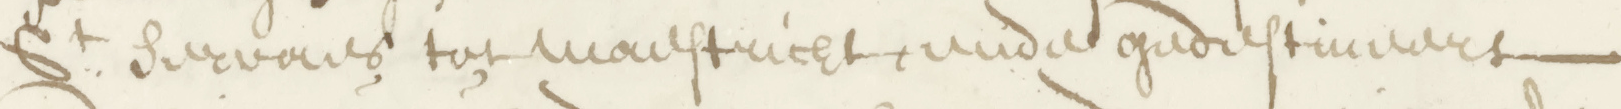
St. Servaes tot maestricht, ende gedestineert
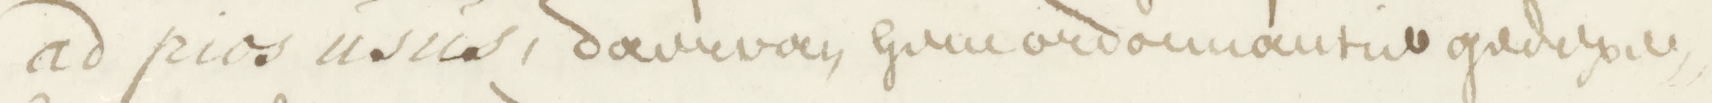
ad pios usus, daervan hem ordonnantie gedepe„
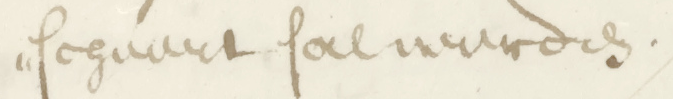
„scheert sal werden.
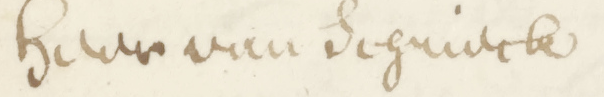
heer van Schrieck
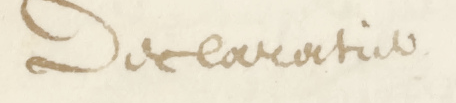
Declaratie
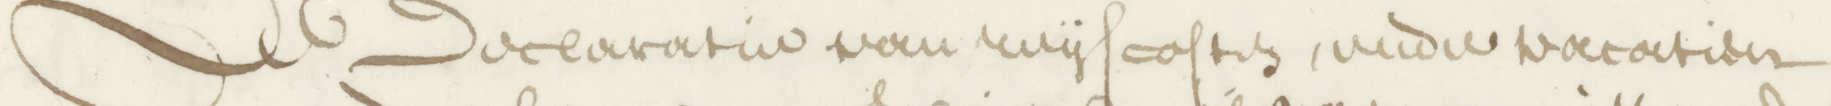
De Declaratie van reijscosten, ende vacatien
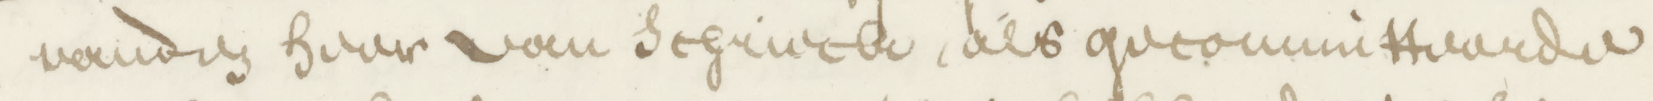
vanden heer van Schrieck, als gecommitteerde
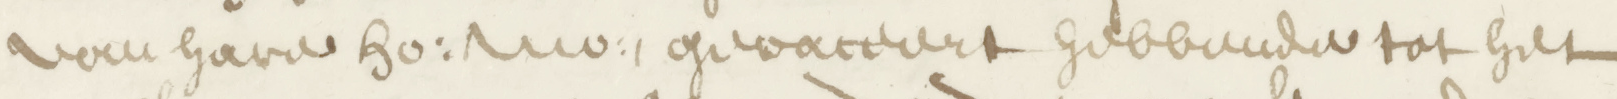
van hare ho:Mo: gevaceert hebbende tot het
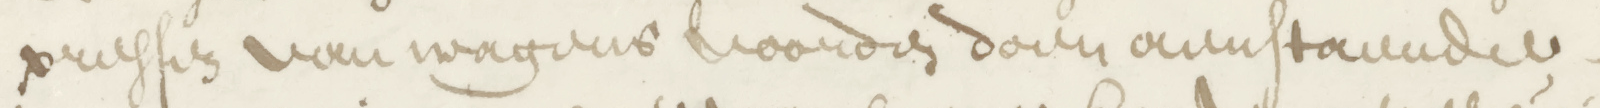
pressen van wagens voorden doen aenstaende
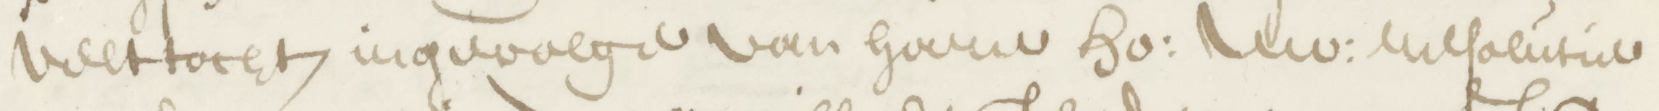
velttocht, ingevolge van hare Ho:Mo: resolutie
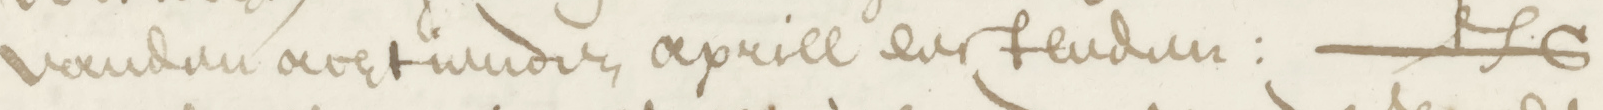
vanden achtienden aprill lestleden: Is
